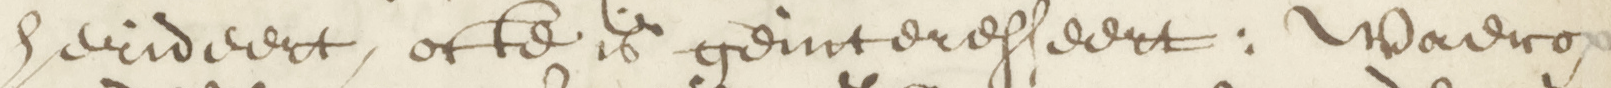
herideert, ofte is geinteresseert: Waerop
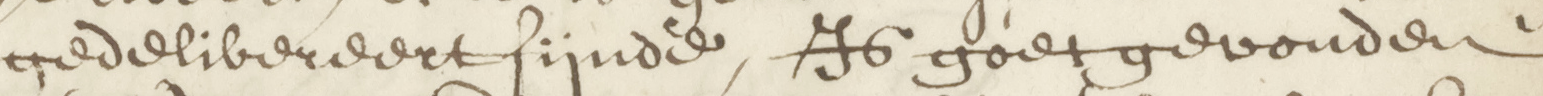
gedelibereert sijnde, Is goetgevonden
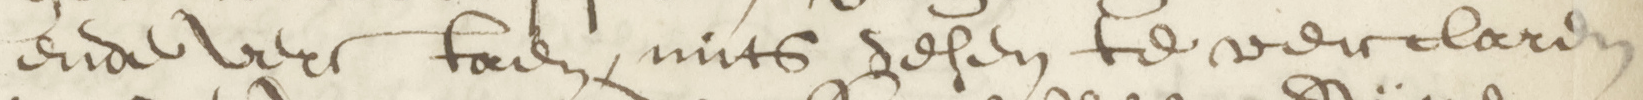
ende verstaen, mits desen te verclaren
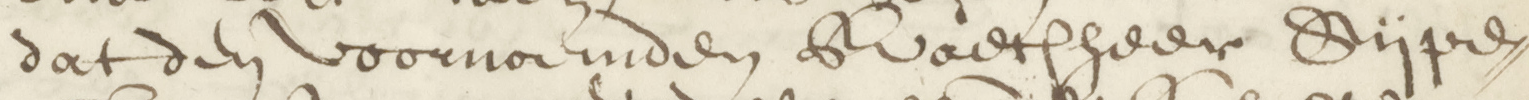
dat den voornoemden Raetsheer Sijpe„
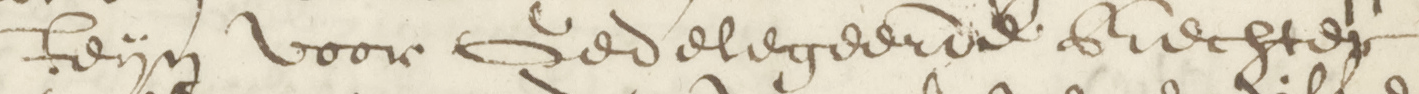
steijn voor Gedelegeerde Rechter
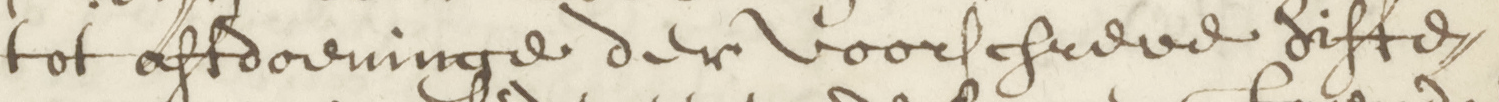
tot affdoeninge der voorschreve diffe„
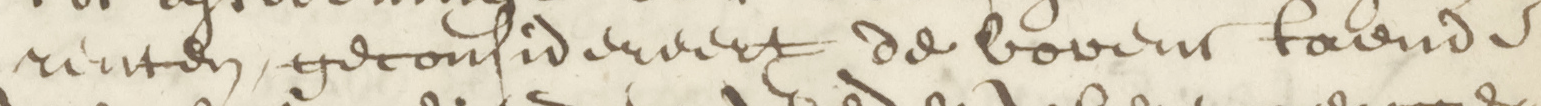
renten, geconsidereert de bovenstaende
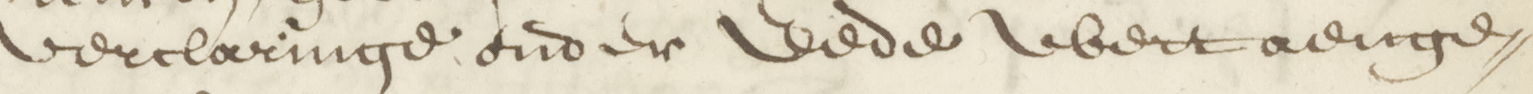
verclaringe onder eede wert aenge„
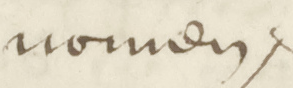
nomen.
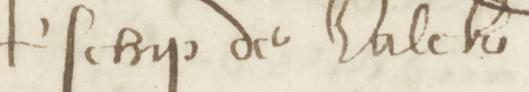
t' schip de Valck
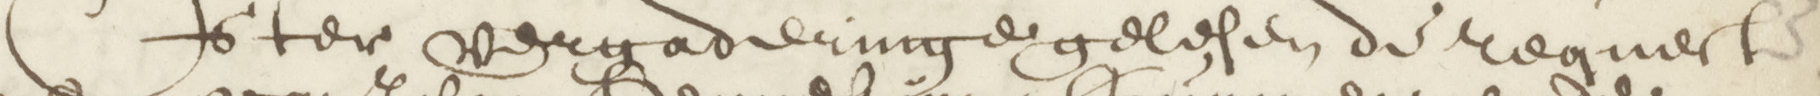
Is ter Vergaderinge gelesen de requeste
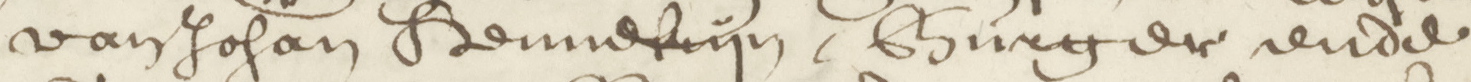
van Johan Hennekijn, Burger ende
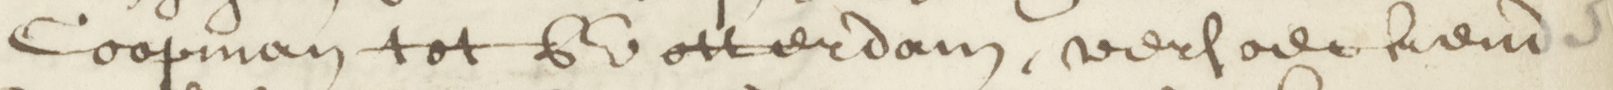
Coopman tot Rotterdam, versoeckende
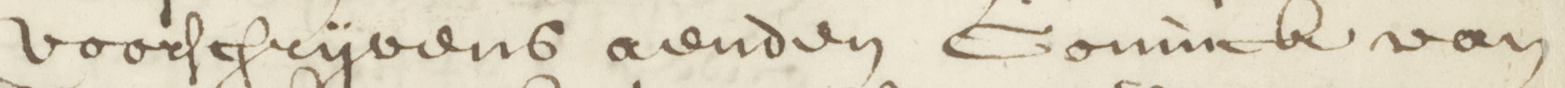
voorschrijvens aenden Coninck van
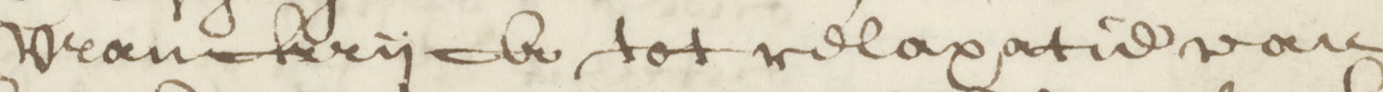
Vranckrijck, tot relaxatie van
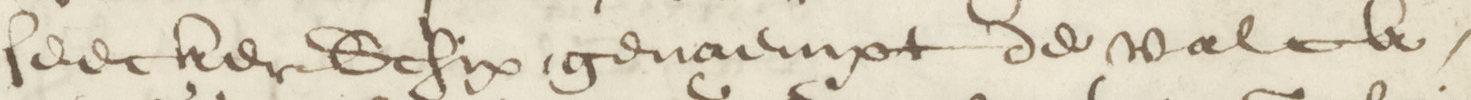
seecker Schip genaempt de Valck,
